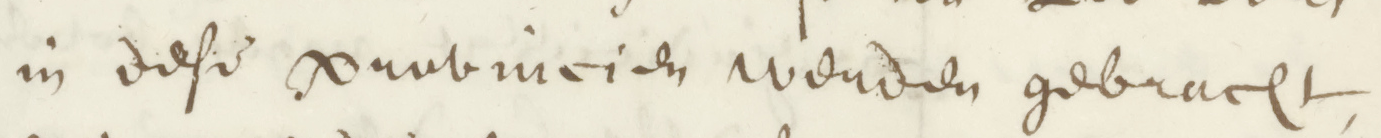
in dese provincien werden gebracht,
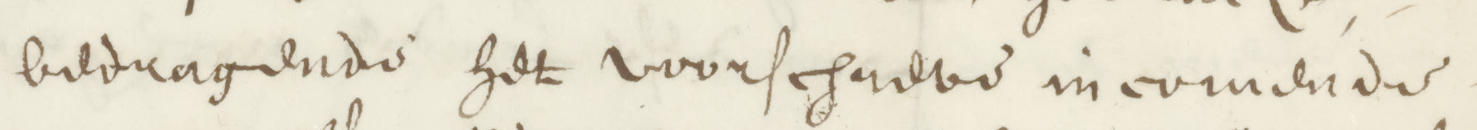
bedragende het voorschreve incomende
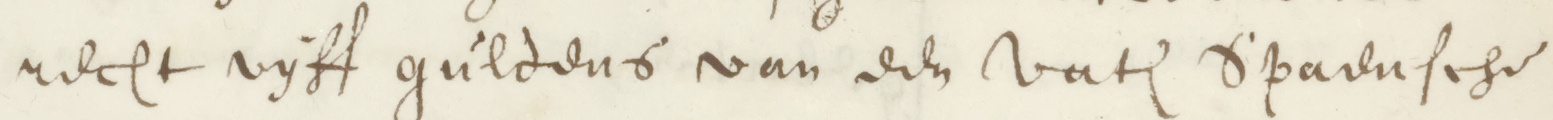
recht vijff guldens van een vath Spaensche
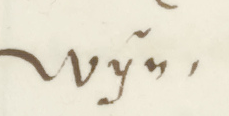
wijn.
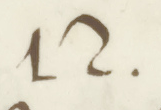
12.
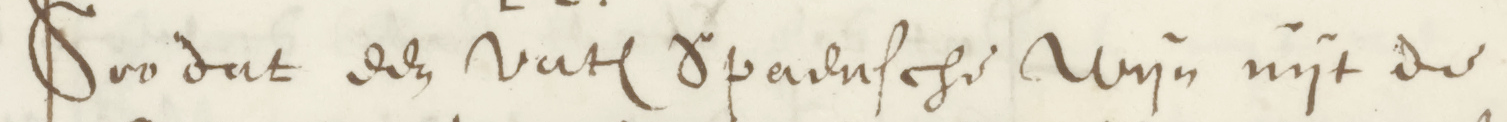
Soo dat een vath Spaensche wijn uijt de
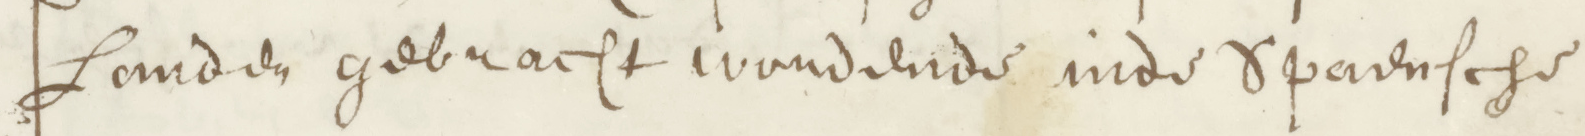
Landen gebracht wordende, inde Spaensche
